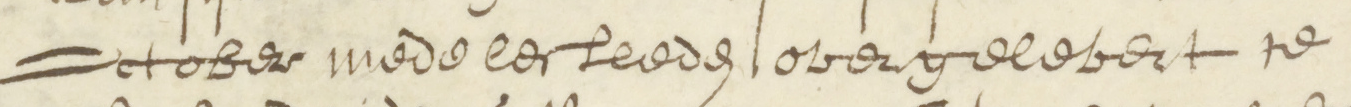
October mede lestleden, overgelevert te
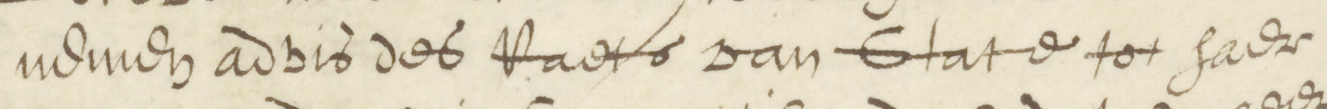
nemen advis des Raets van State tot haer
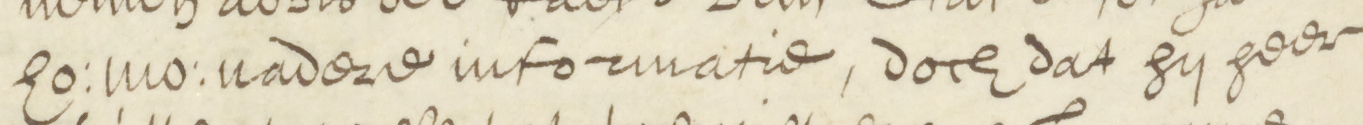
ho:mo: nadere informatie, doch dat hij heer
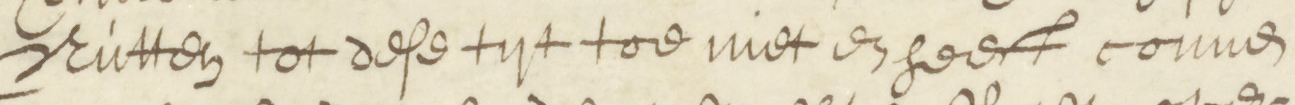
Nutten tot dese tyt toe niet en heeft connen
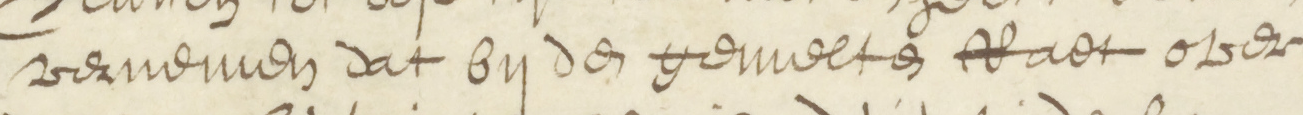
vernemen dat by den gemelten Raet over
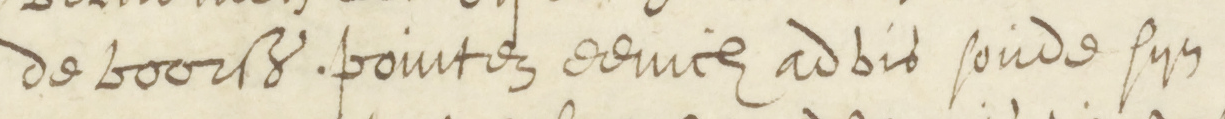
de voors. pointen eenich advis soude syn
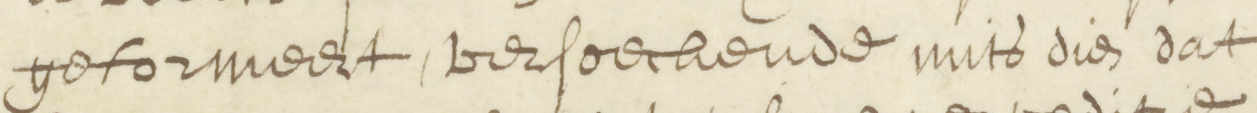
geformeert, versoeckende mits dien dat
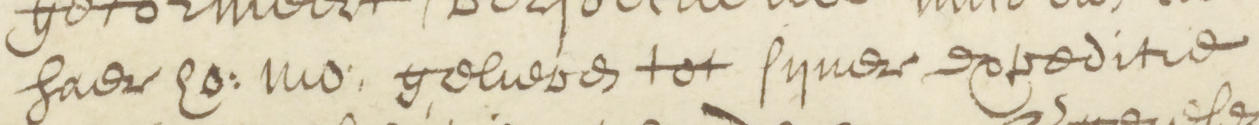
haer ho:mo: gelieven tot syner expeditie
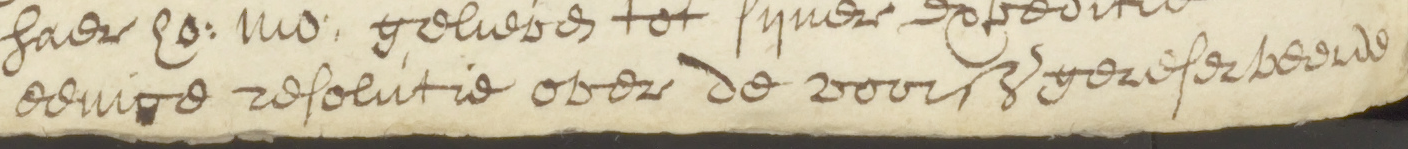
eenige resolutie over de voors gereserveerde
